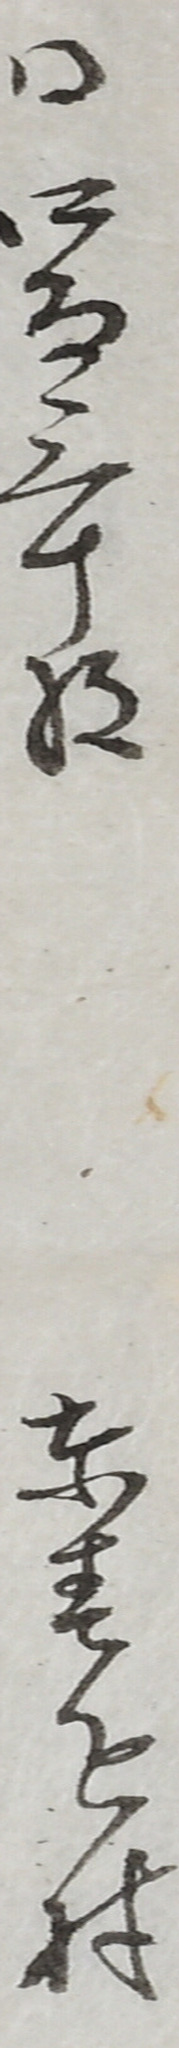同四百三十枚東春近村
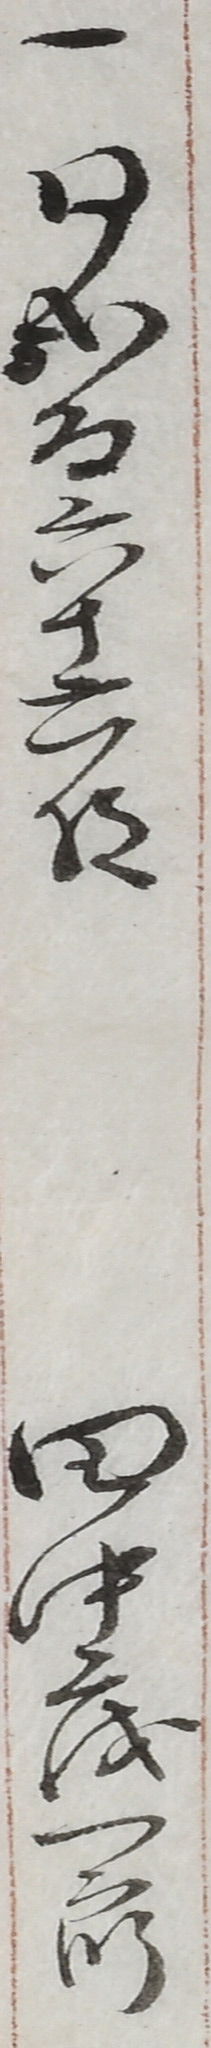一同弐百六十六分田中茂一郎

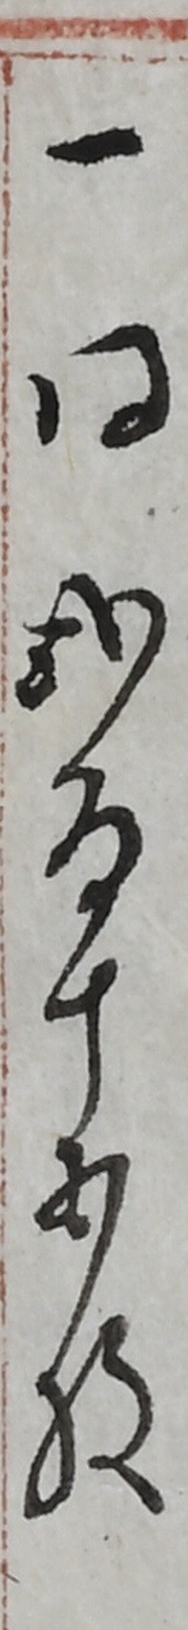一同四百九十六枚
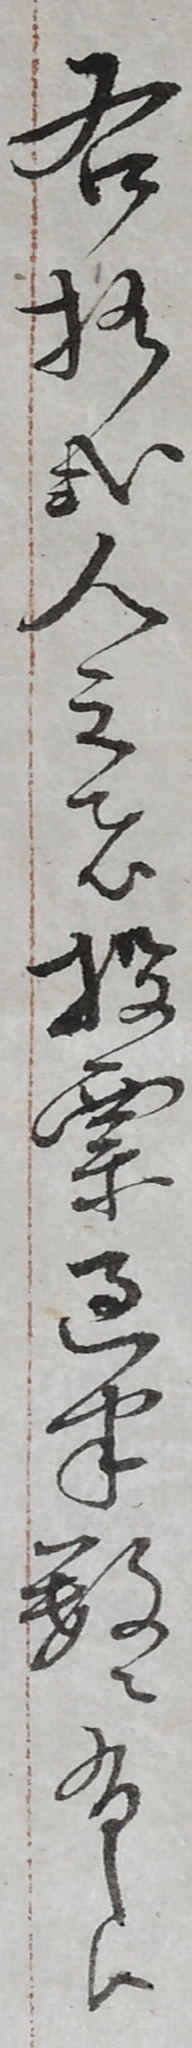右拾弐人之者投票過半数ニ有之候
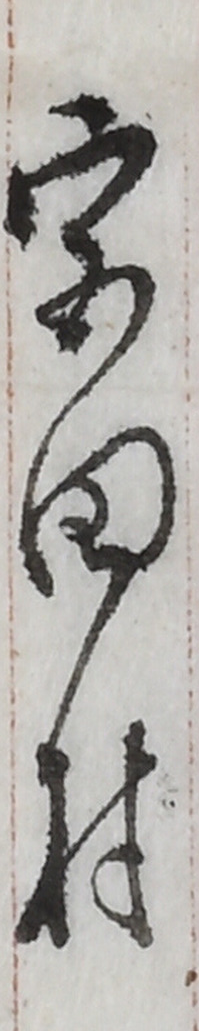宮田村
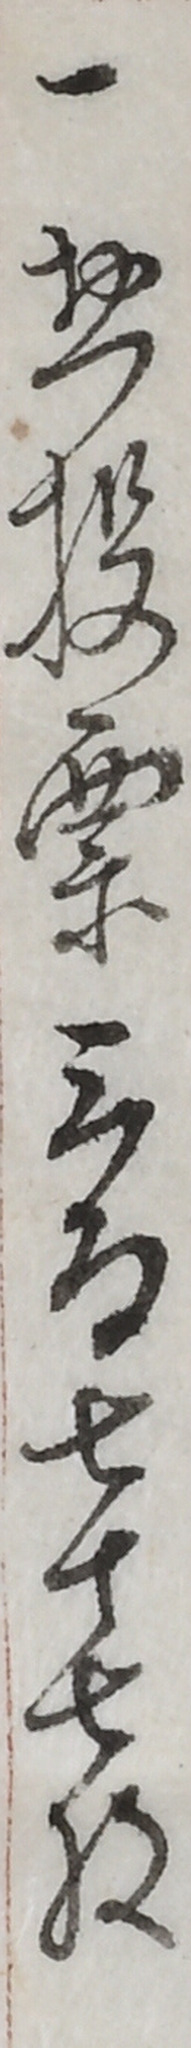一惣投栗三百七十七枚
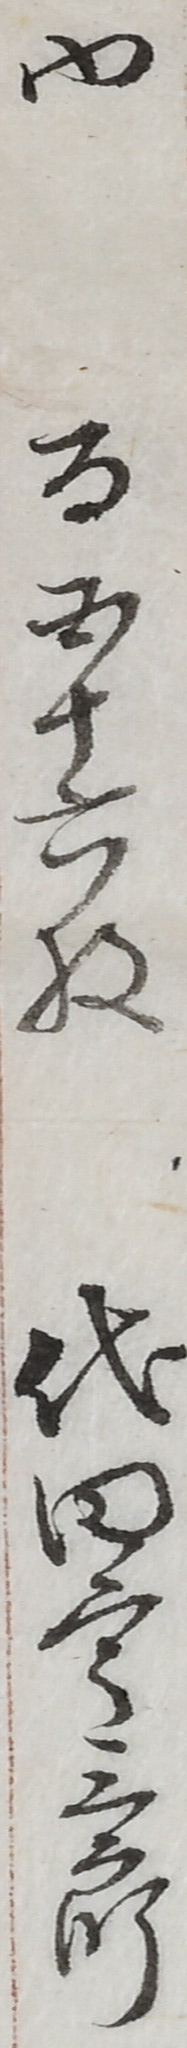内百五十六枚代田宇三郎
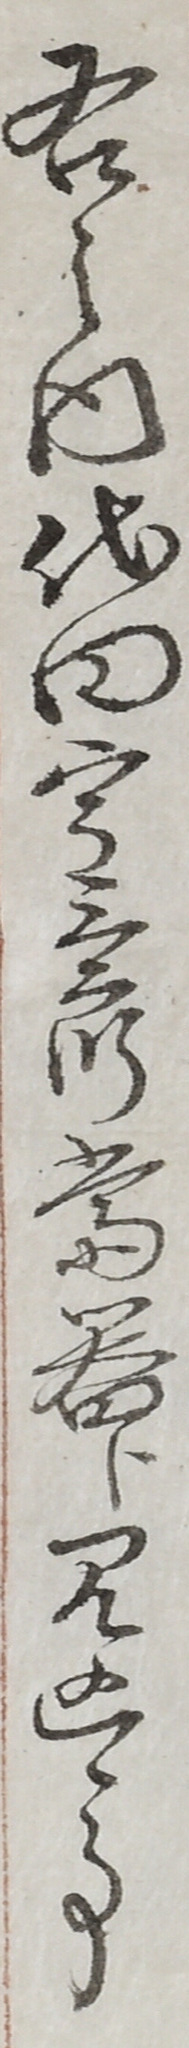右之内代田宇三郎当番ト見込候事
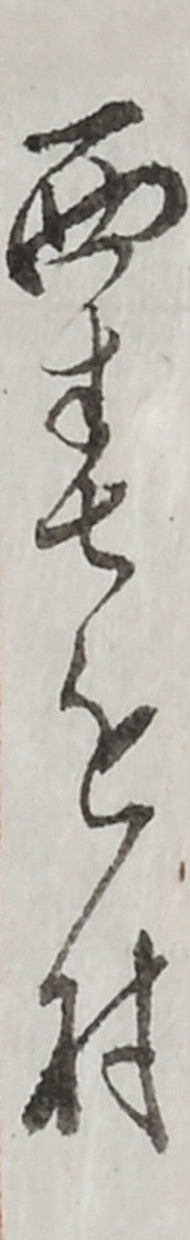西春近村
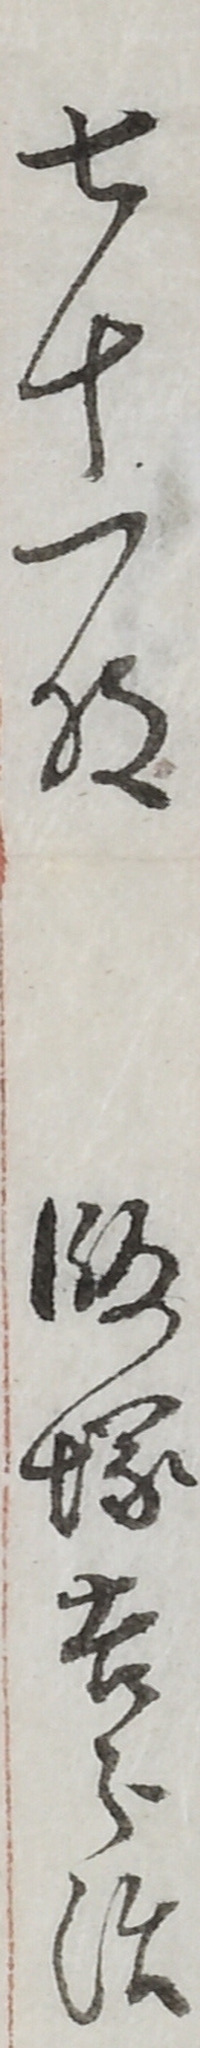七十一枚飯塚吉郎治
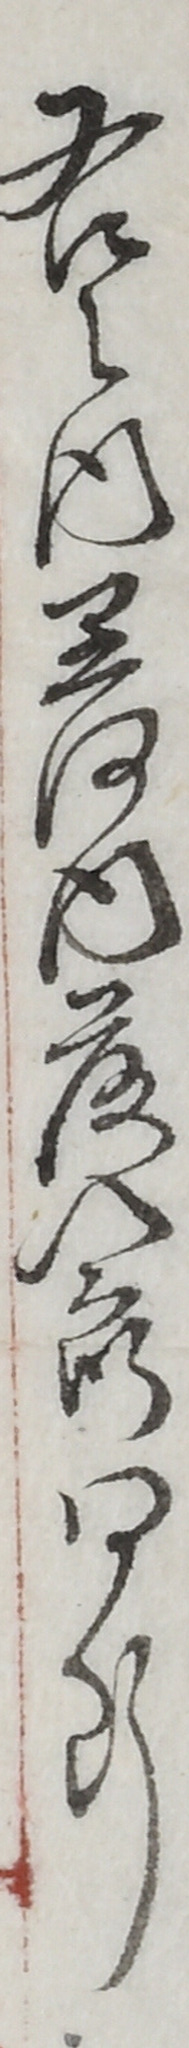右之内黒河内藤八郎同断

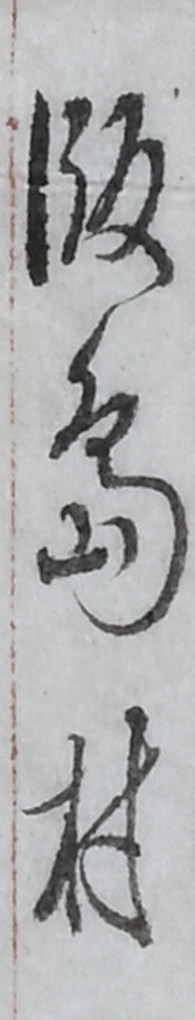飯島村
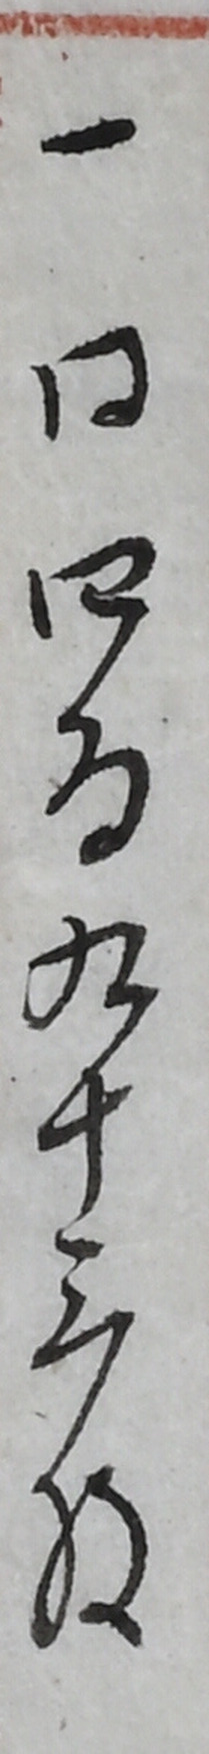一同四百九十三枚
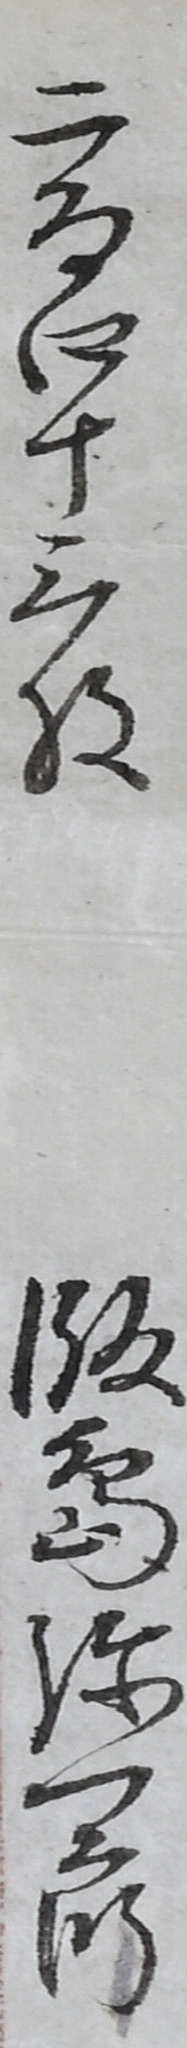二百四十三枚飯島弥一郎
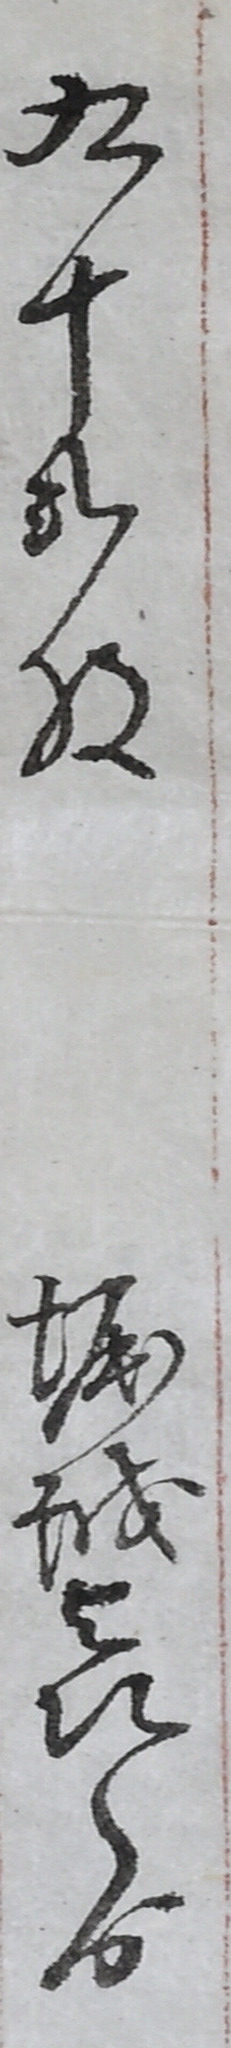九十弐枚堀越与次郎ゟ
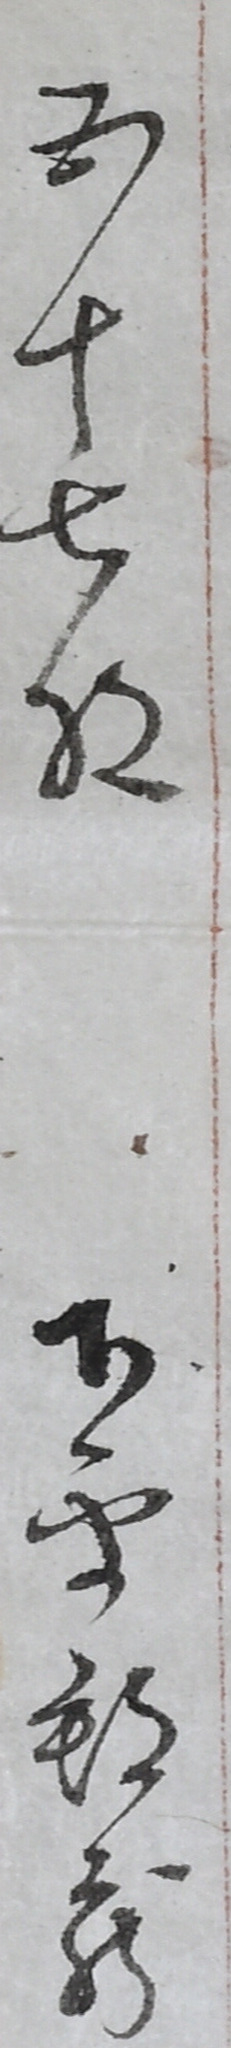五十七枚下平蚊蔵
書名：郡役所勤務中御用抜書
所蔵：伊那市立高遠町図書館・合同会社AMANE
